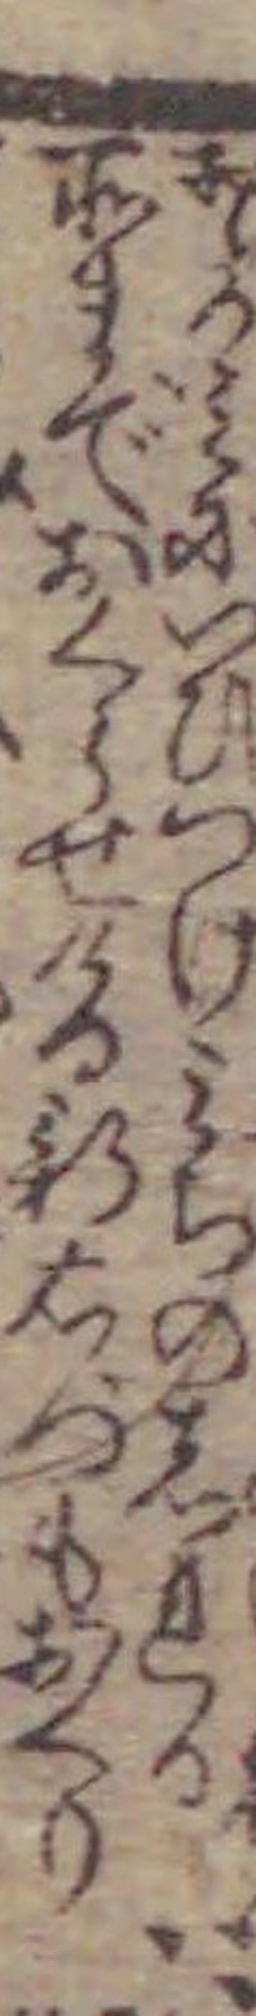所までおくらせける心右衛門もおくり
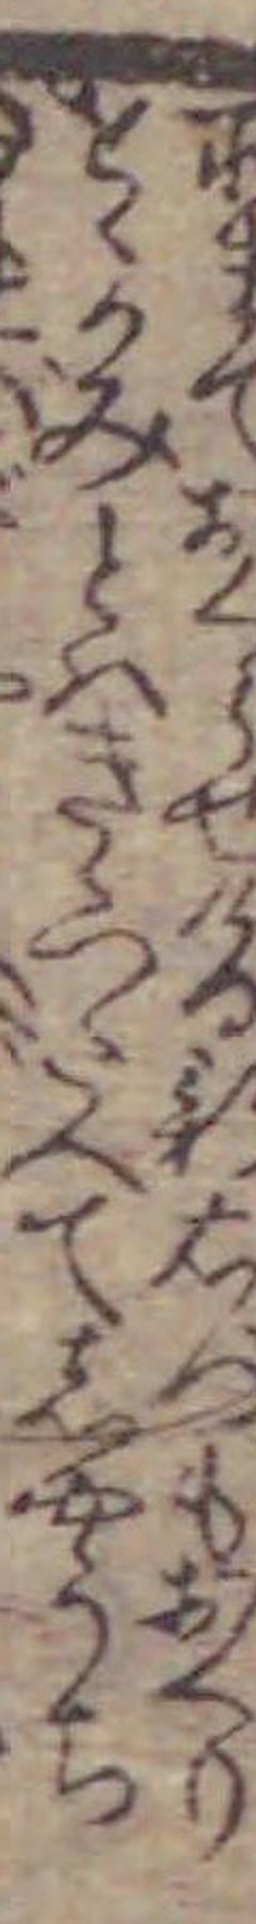をゝかみとはきゝつたへてしやうち
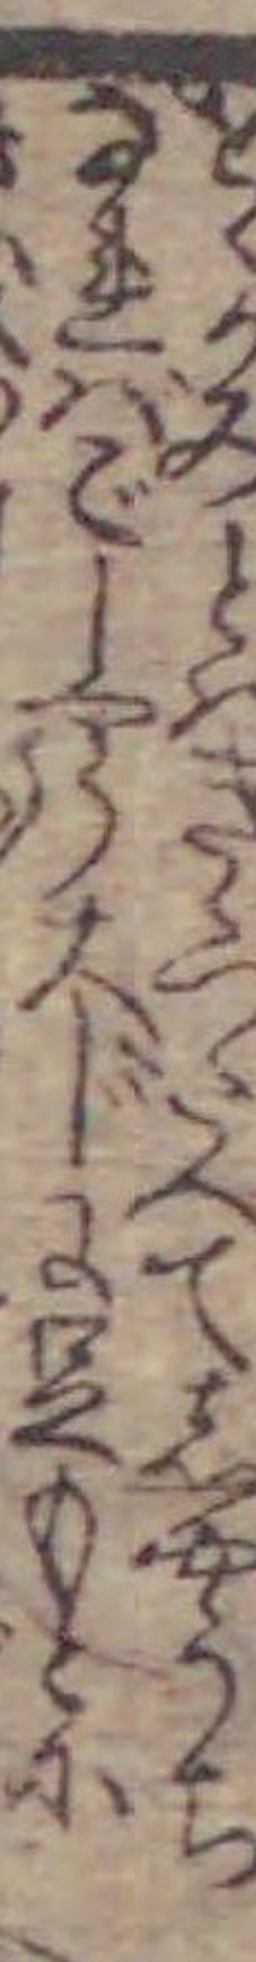なればごしやう大じに足もとに
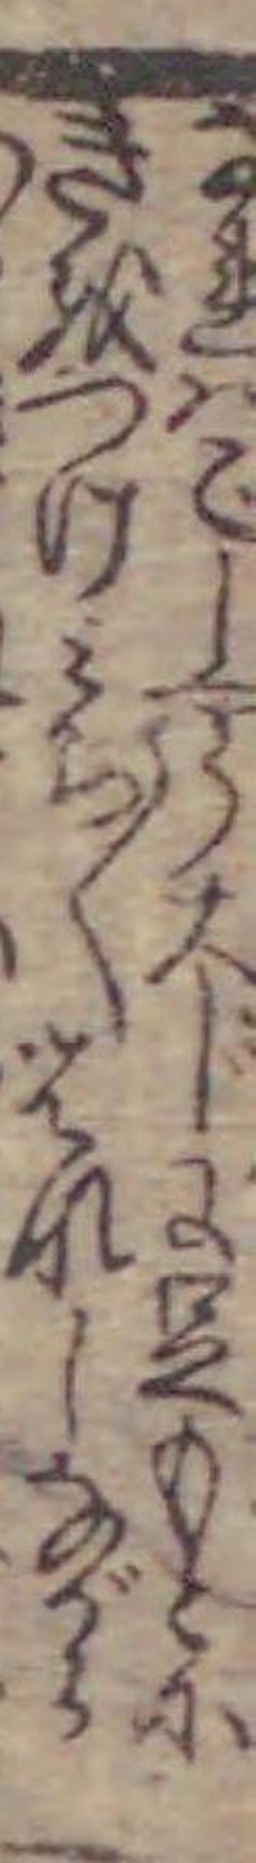きをつけみち〳〵はなしながら
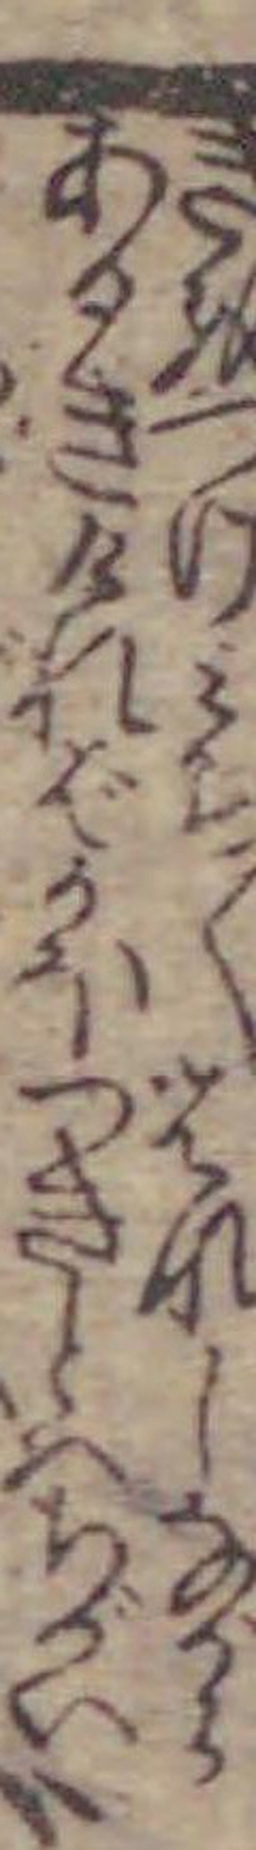あるきければかほつきとはちがい
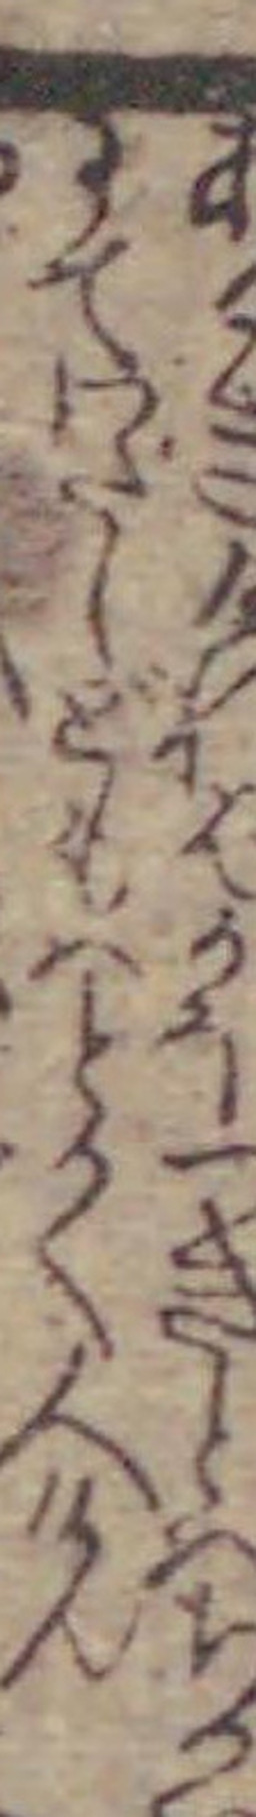にてわたくしどもはとかく人けん
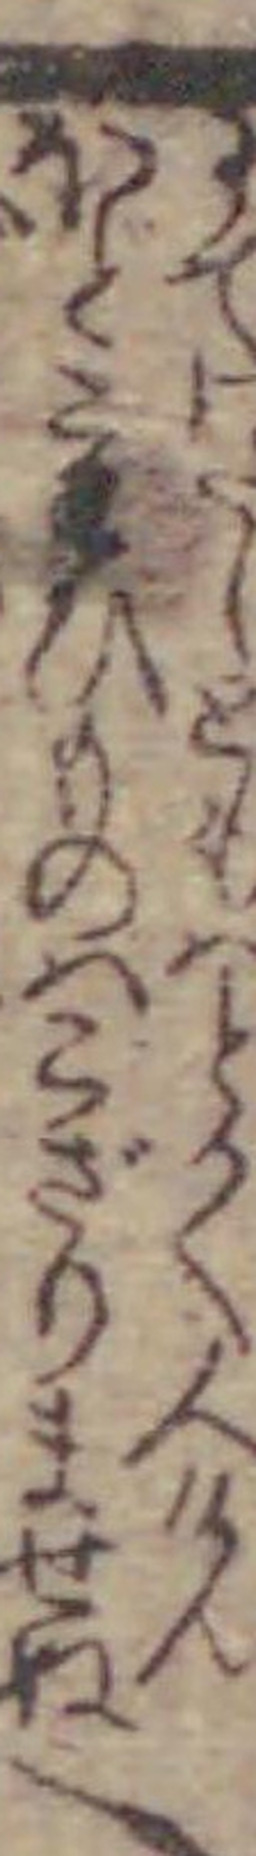ほどこわひものはこざりませぬ
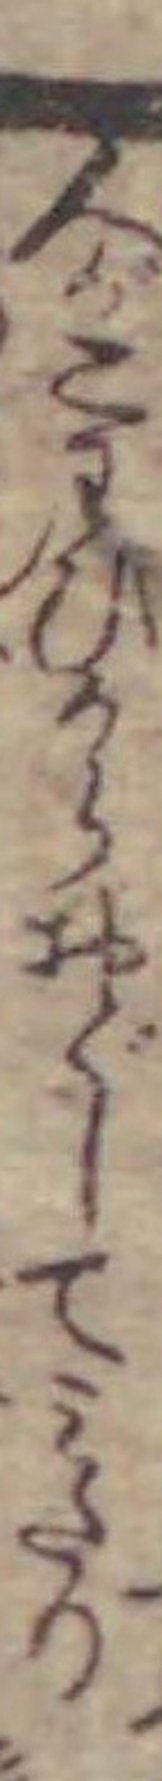人がこわひからおどしてみたり
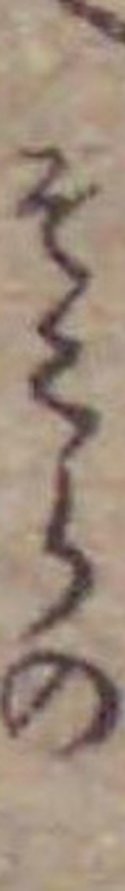そこらの
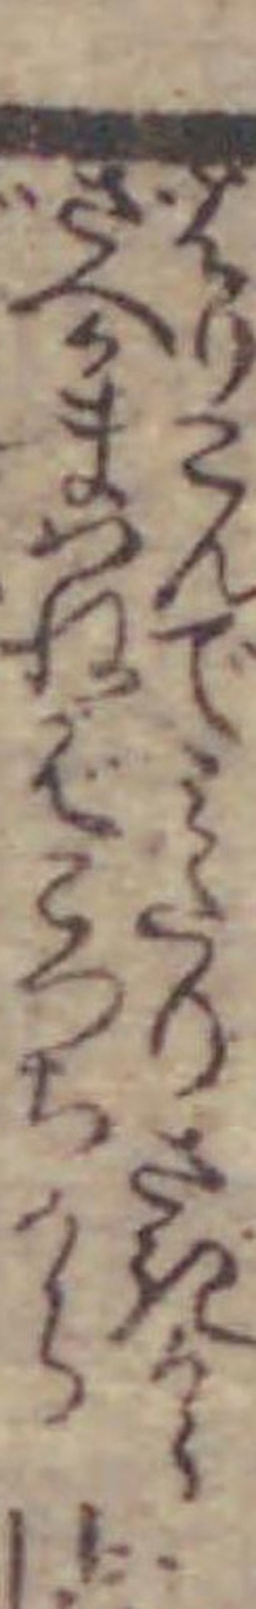さへかまはねばこつちから
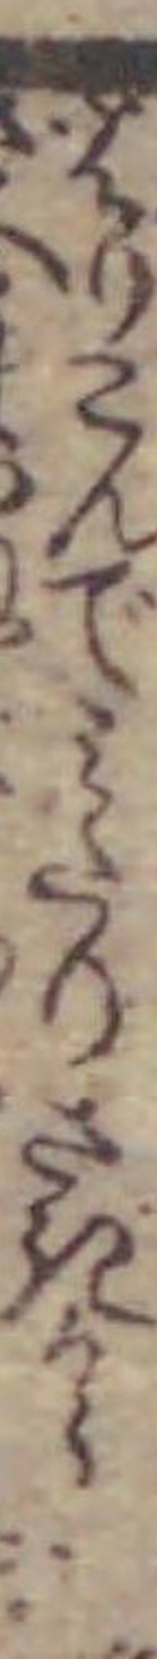はりこんでみたりさきから
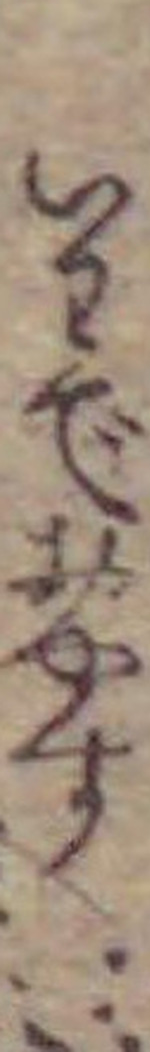いわでおやすみ
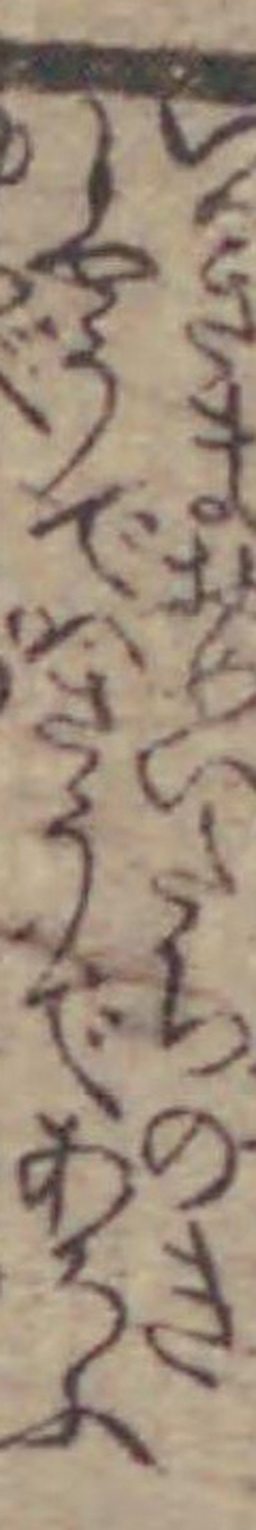しやうではさうであろふ
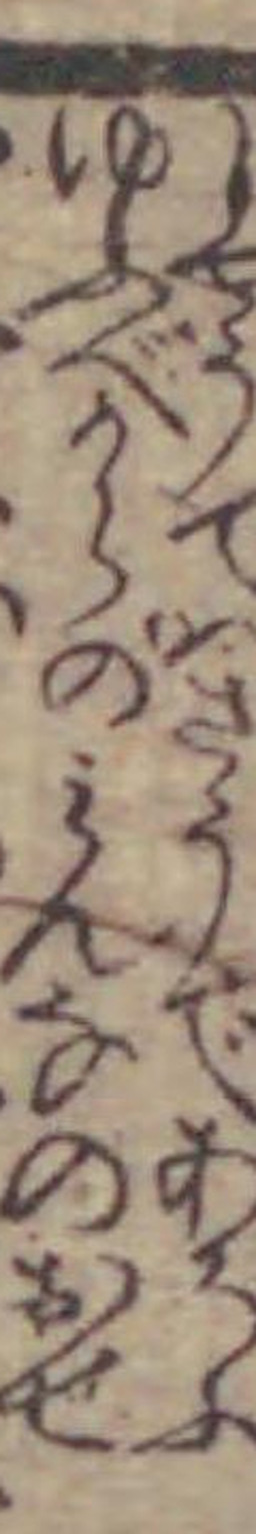ゆふべからのみんなのおせ
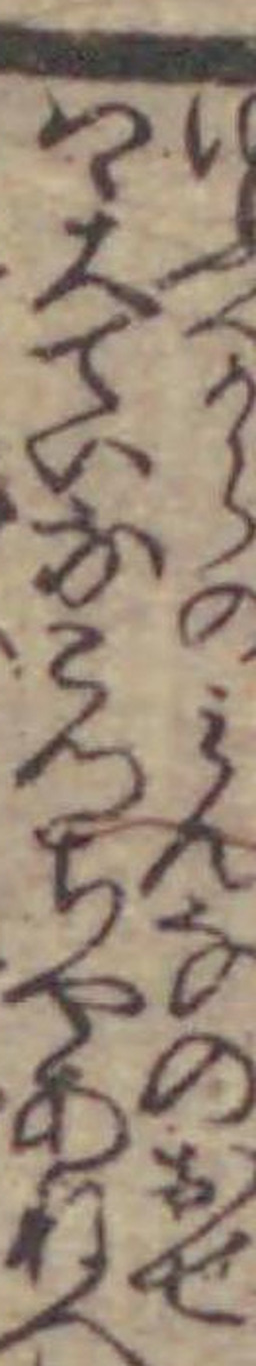はゝ大ていなこつちやねへ
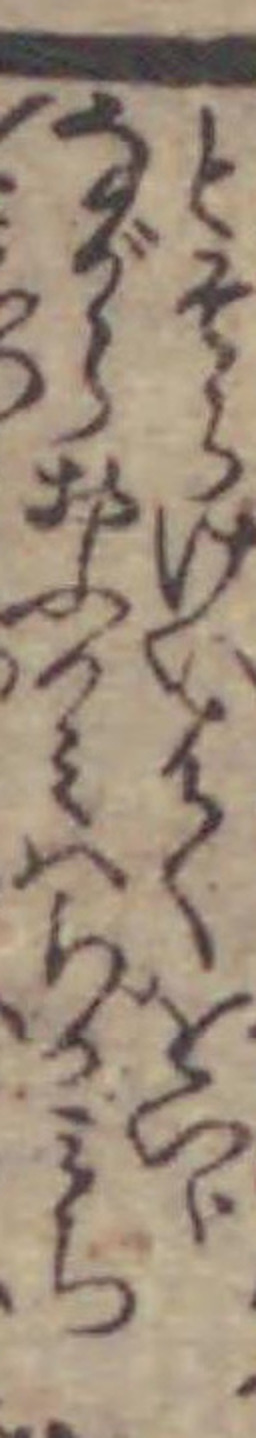ながらおふかみはちかみち
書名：即席耳学問 : 3巻
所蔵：国立国会図書館 National Diet Library, JAPAN
